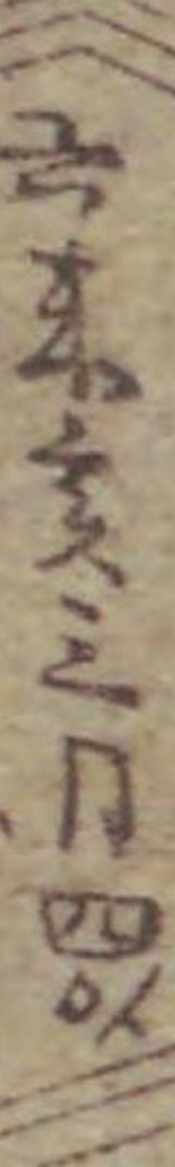去来亥三月四日ゟ

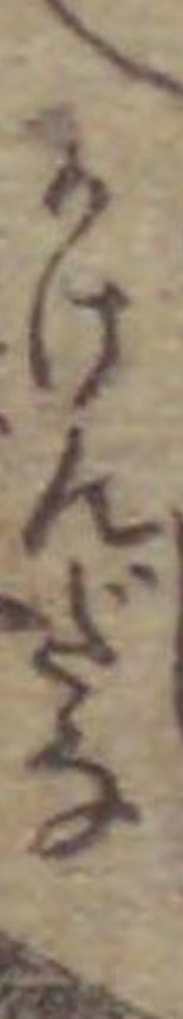かけんだな
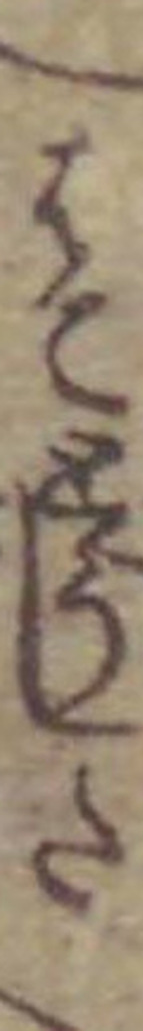はてとうした
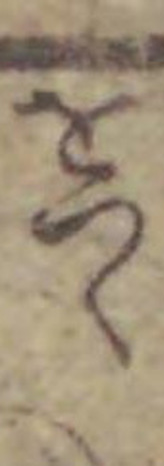をつく
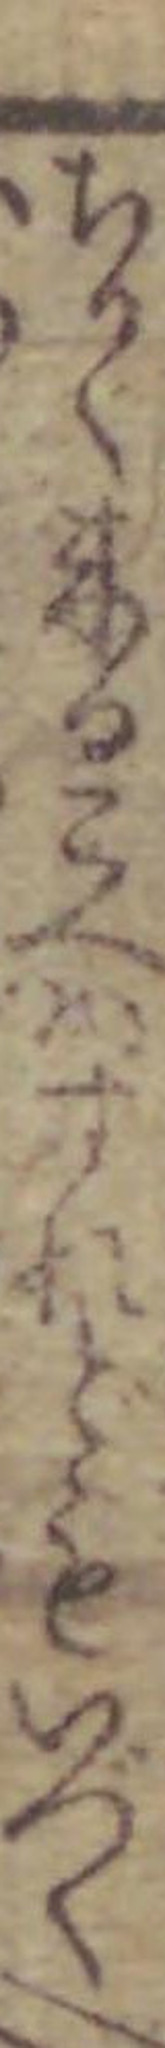ちかく来るこへはすれどもいづく
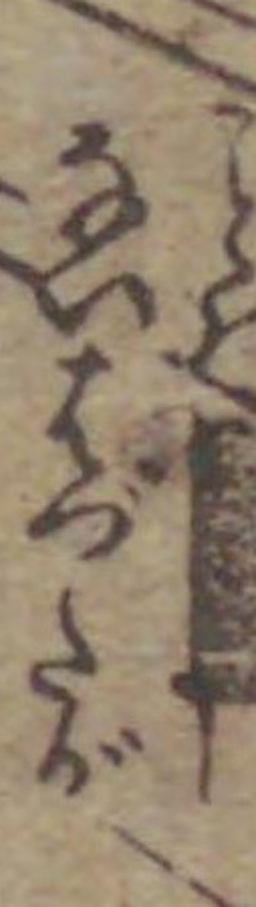ないはづたが
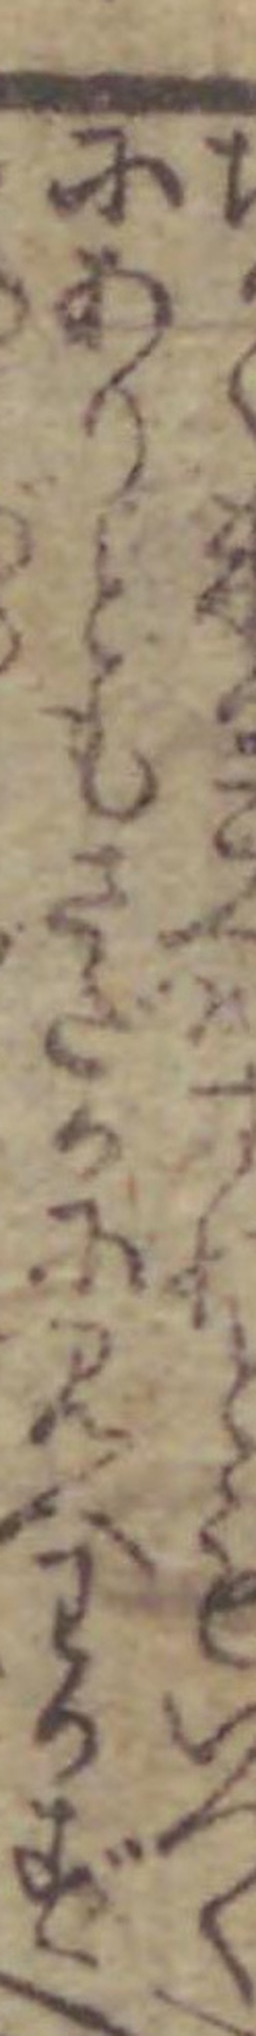にありともさだかに見へわかず
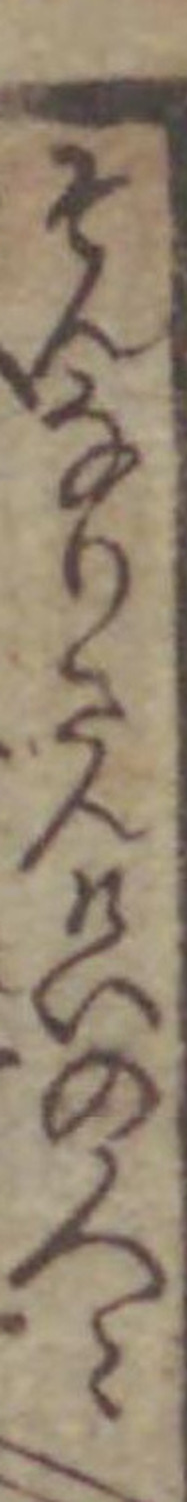そんなりさんけいの人々
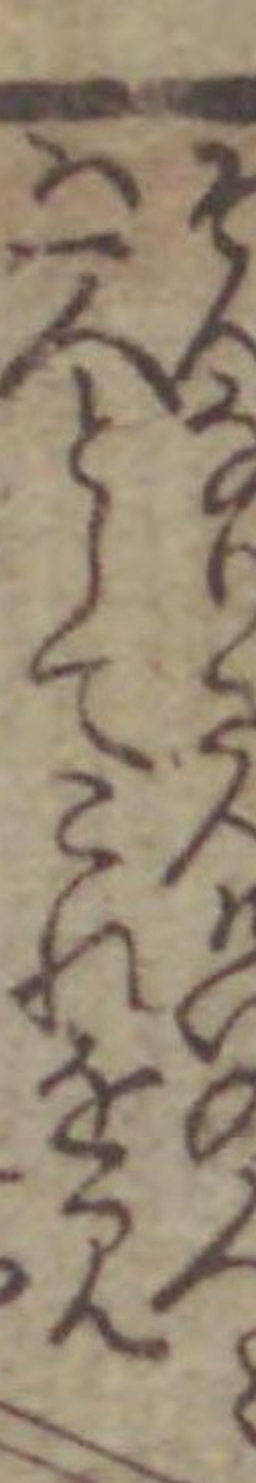は一人としてこれを見
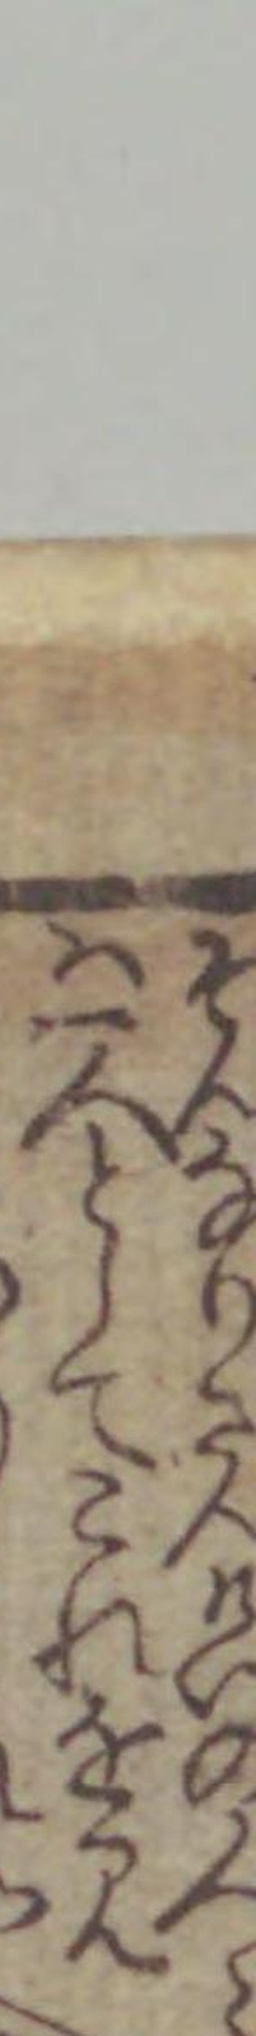は一人としてこれを見
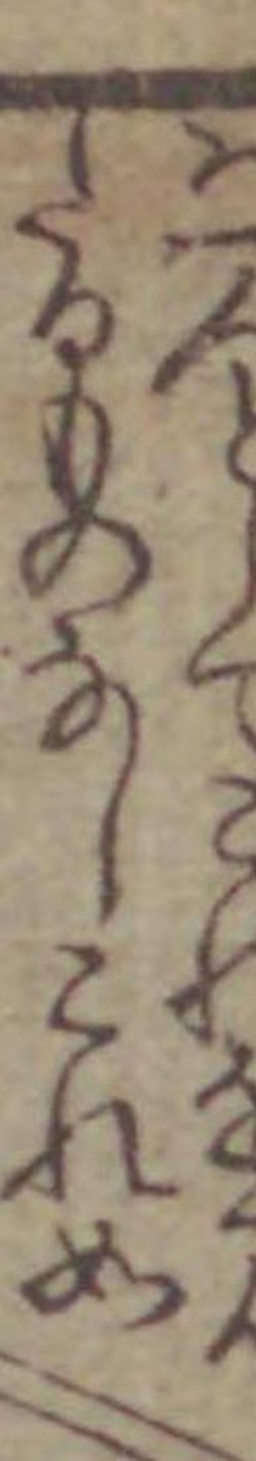たるものなしこれ如
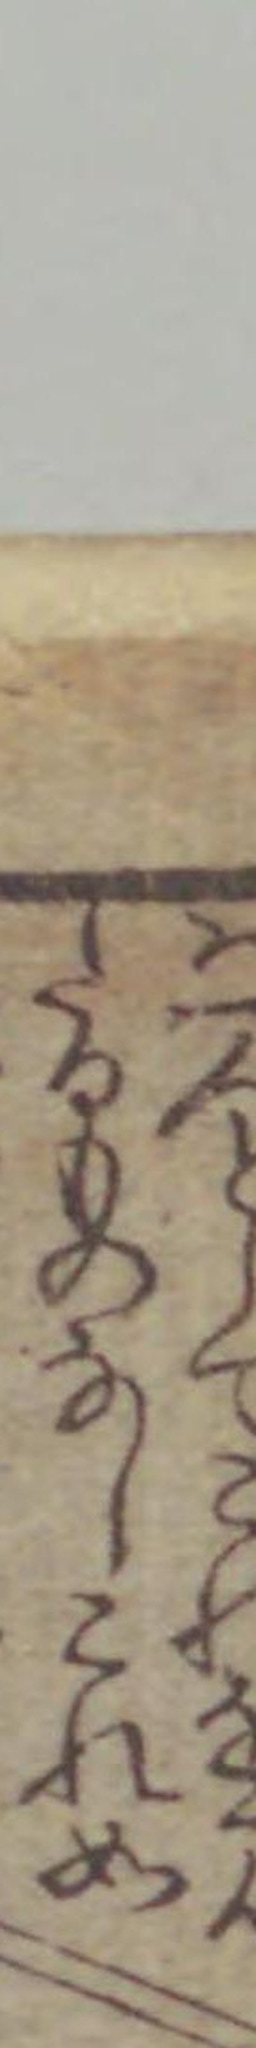たるものなしこれ如
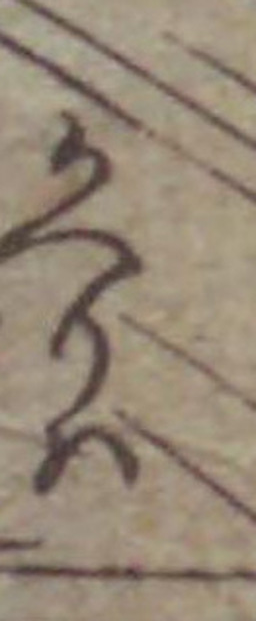かへりは
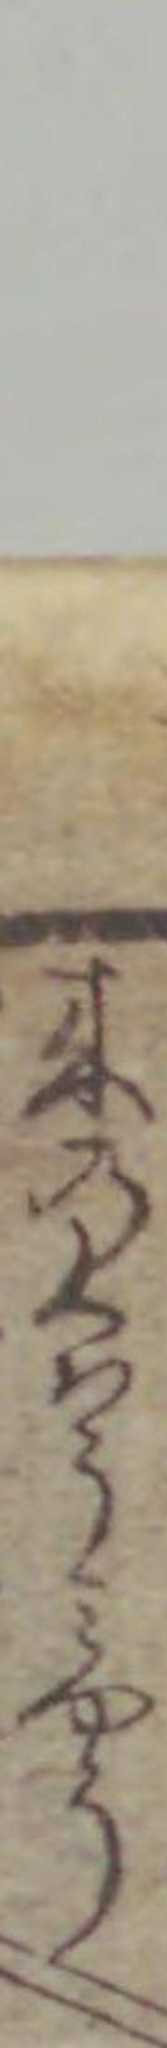来のくはうみやう
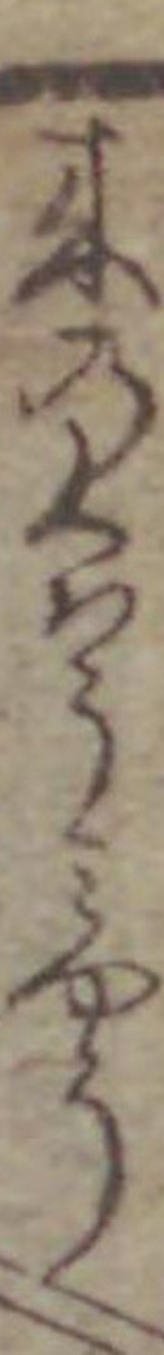来のくはうみやう
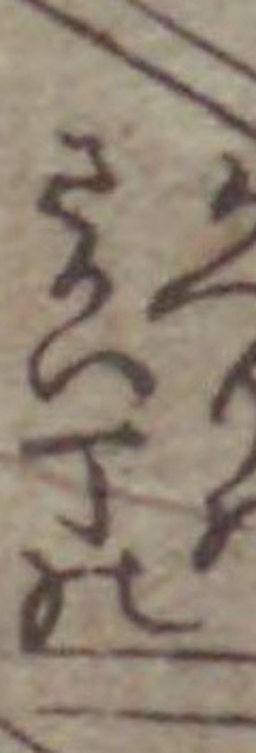さかい丁の
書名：鬼の趣向草 2巻
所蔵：国立国会図書館 National Diet Library, JAPAN
